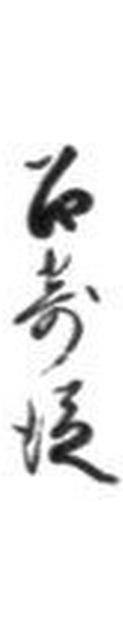召寄従
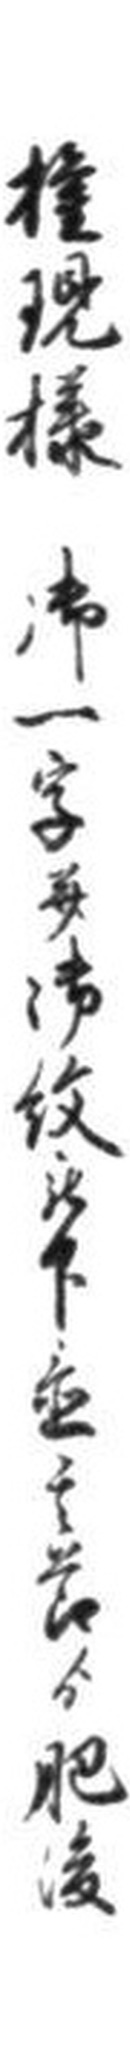権現様御一字并御紋被下置其節ゟ肥後
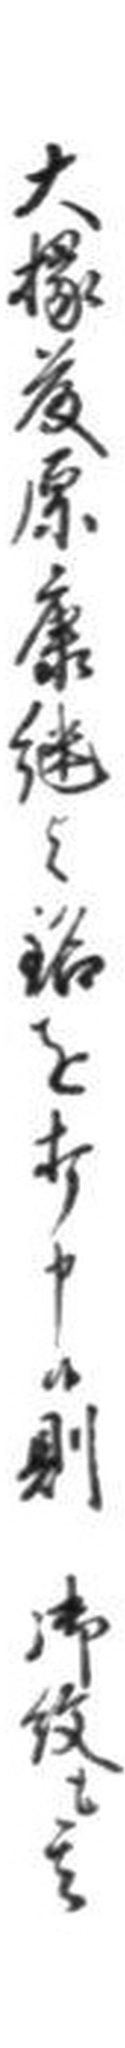大掾藤原康継与銘を打申候則御紋も其
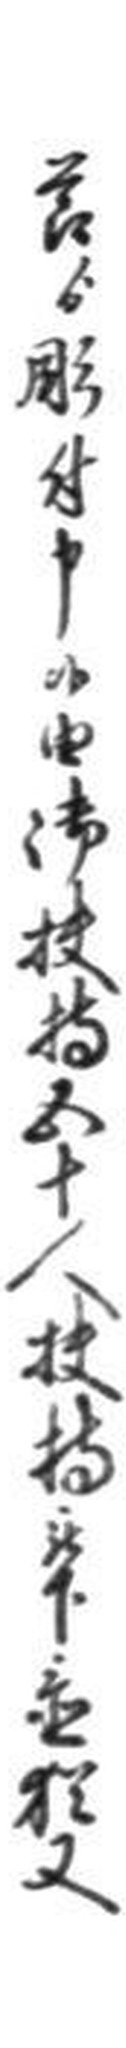節ゟ彫付申候由御扶持五十人扶持被下置猶又
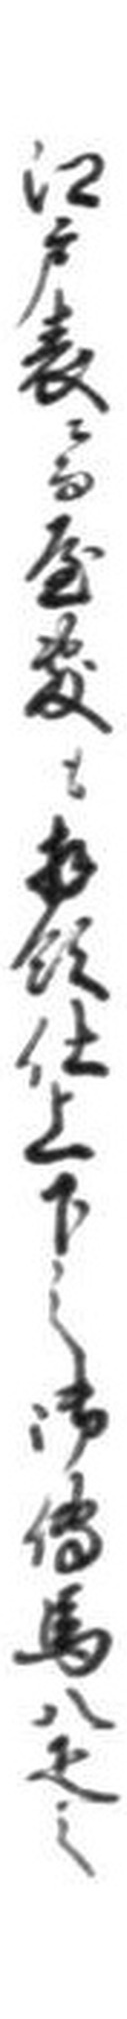江戸表ニ而屋敷も拝領仕上下之御伝馬八疋之
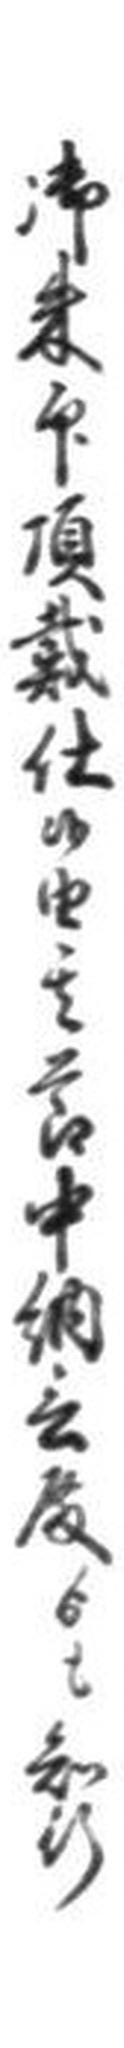御朱印頂戴仕候由其節中納言殿ゟも知行
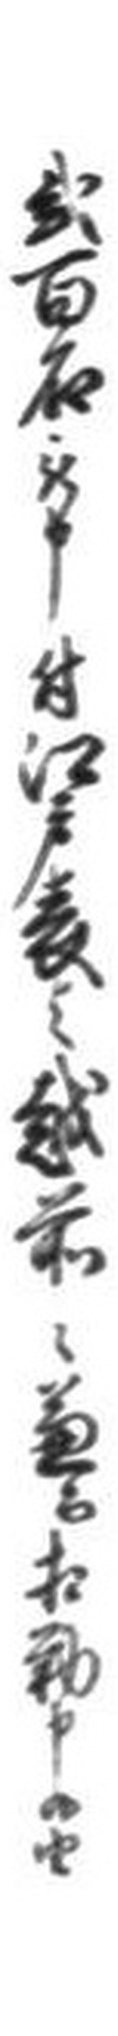弐百石被申付江戸表与越前ニ兼而相勤申候由
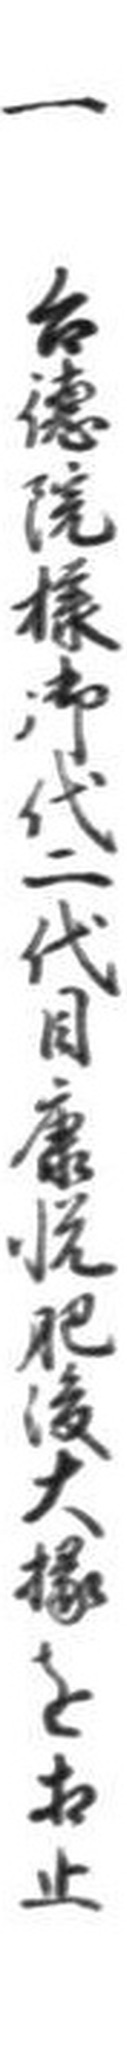一台徳院様御代二代目康悦肥後大掾を相止
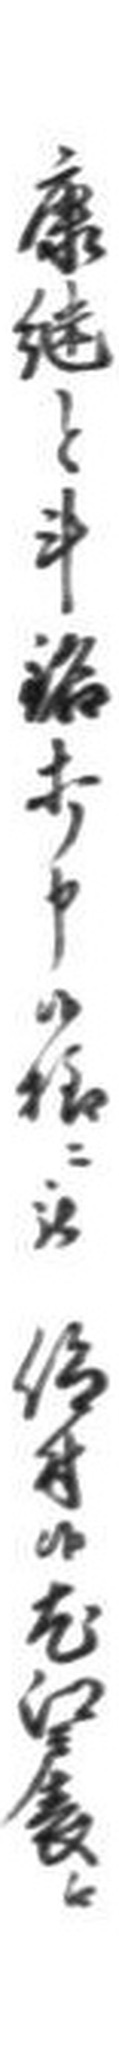康継と斗銘打申候様ニ被仰付候尤江戸表江
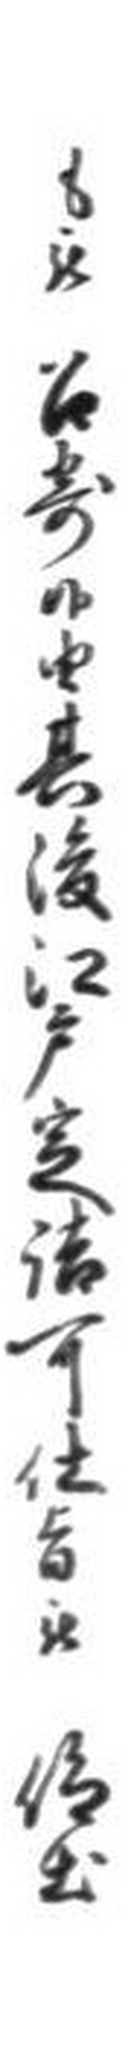も被召寄候由其後江戸定詰可仕旨被仰出
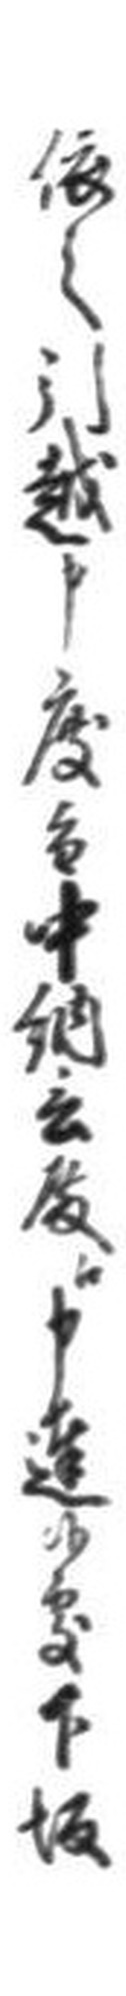依之引越申度旨中納言殿江申達候処下坂
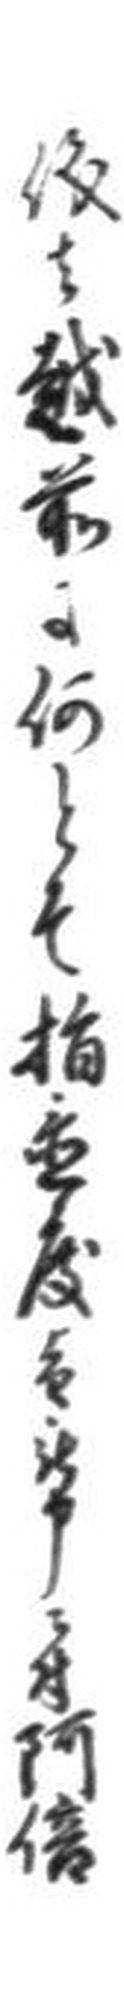儀者越前に何とそ指置度旨被申ニ付阿倍

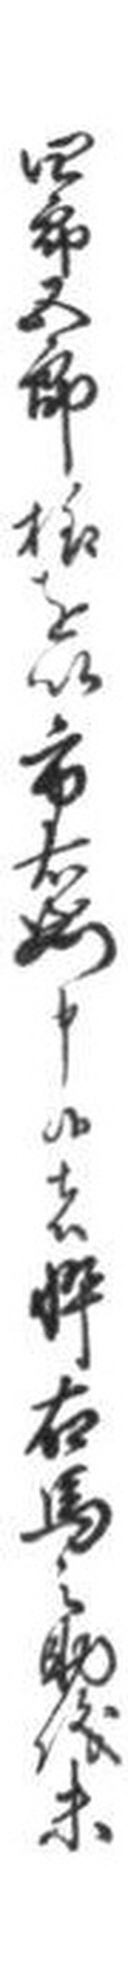四郎五郎様を以市右衛門申候者忰右馬之助儀未
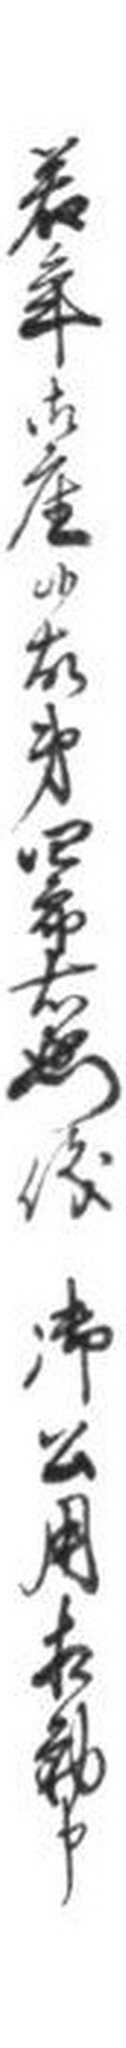若年御座候故弟四郎右衛門儀御公用相勤申
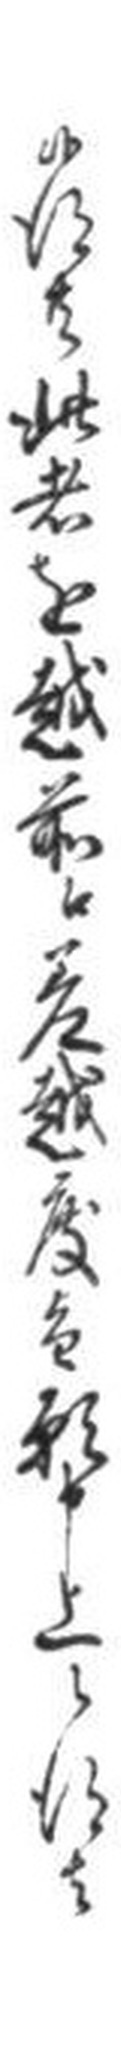候得共此者を越前江差越度旨願申上候得者
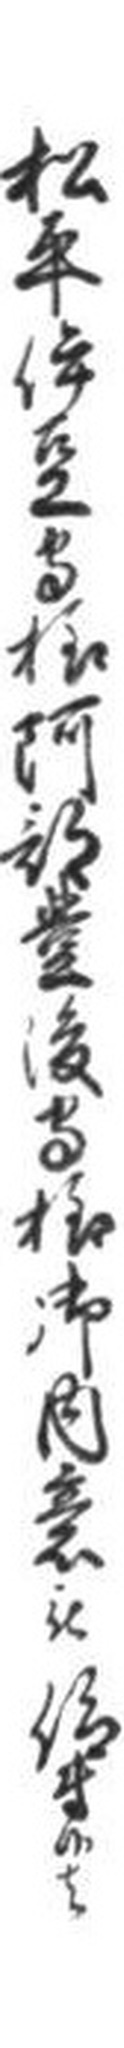松平伊豆守様阿部豊後守様御内意被仰付候者
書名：家譜 三十三 吉邦公 享保四年
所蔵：福井県文書館 Fukui Prefectural Archives
